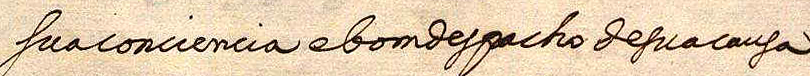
sua conciencia e bom despacho de sua causa
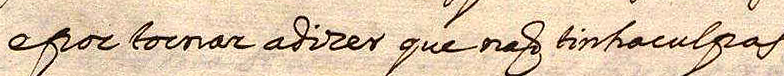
e por tornar a dizer que naõ tinha culpas
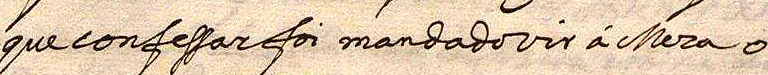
que confessar foi mandado vir á Meza o
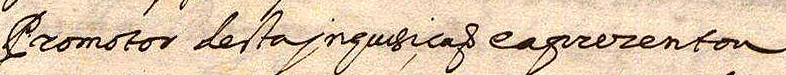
Promotor desta jnquisiçaõ e aprezentou
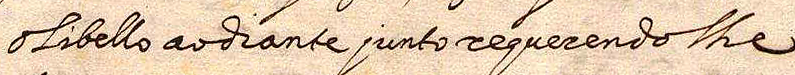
o Libello aodiante junto requerendolhe
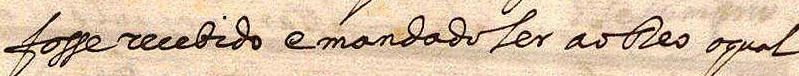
fosse recebido e mandado Ler ao Reo o qual
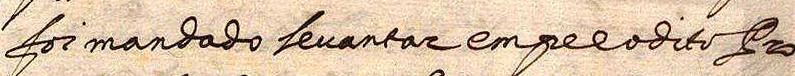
foi mandado leuantar em que o dito Pro
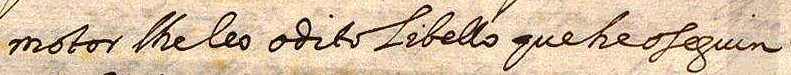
motor lhe leo o dito Libello que he o seguin
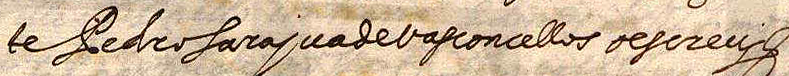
te Pedro sarajua de vasconcellos o escrevj
